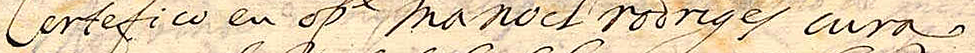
Certefico eu o pe manoel rodriges cura
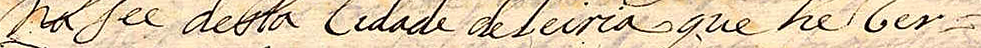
na see desta Cidade de Leiria que he ver
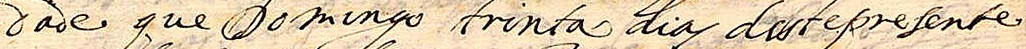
dade que Domingo trinta dias deste presente
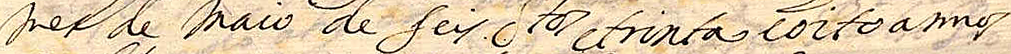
mes de maio de seisctos e trinta e oito annos
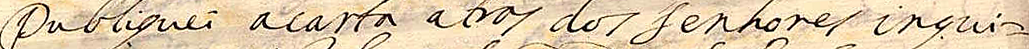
Publiquei a carta atras dos senhores inqui
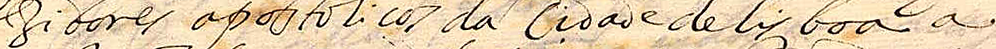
zidores apostolicos da Cidade de lisboa a
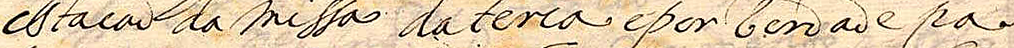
estacaõ da missa da terca e por verdade pa
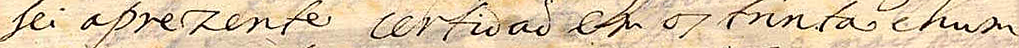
sei a prezente certidaõ em os trinta e hum
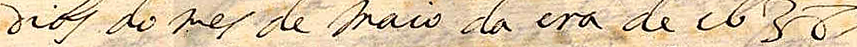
dias do mes de maio da era de 1638
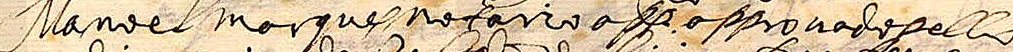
Manoel marques notario app̄co approuado pello
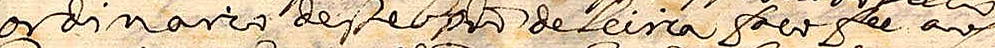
ordinario deste bpdō de leiria faco fee aos
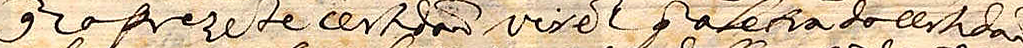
q̄ ha prezete certidão virē q̄ a letra da certidaõ
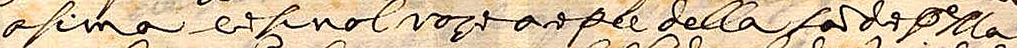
asima e o sinal razo ao pee della sā do p̄e Ma
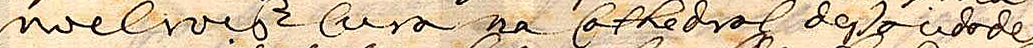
noel roiz̄ Cura na Cathedral desta cidade
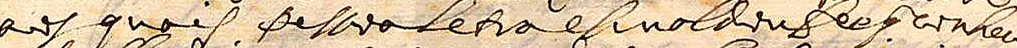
aos quais pessoa letra e sinal dou fee q̄ conheço
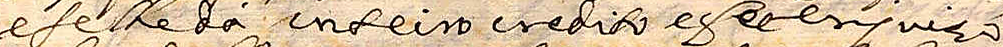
e se lhe dá inteiro credito e fee em juizo
